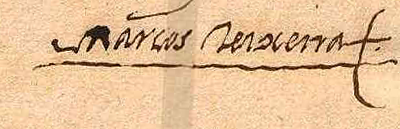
Marcos teixeira
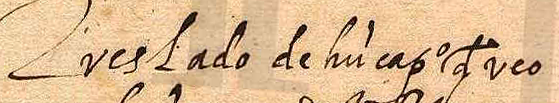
Treslado de hū capo q̄ veo
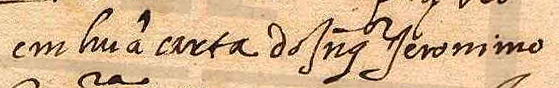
em huā carta do Jn̄qor Jeronimo
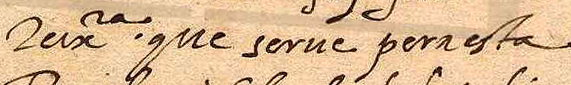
Teixra. que serue pera esta
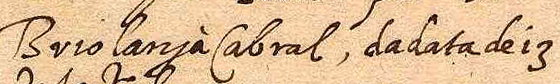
Briolanja Cabral, da data de 13
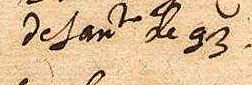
de Ianro de 93.
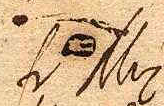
frco Miz̄
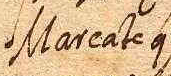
Mareāte q̄
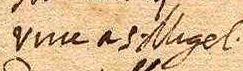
viue a s. Migel
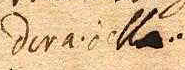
dira della.
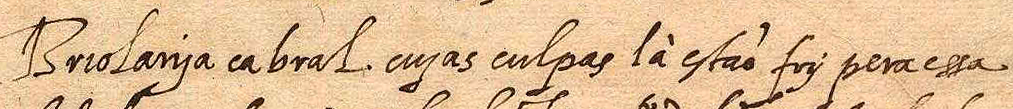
Briolanja cabraL cujas culpas là estaõ foy pera essa
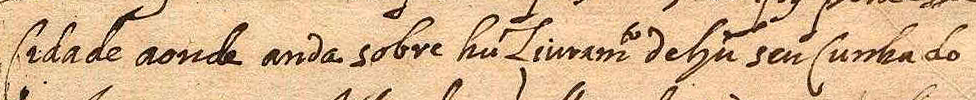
Cidade aonde anda sobre hū Liuramto de hū seu Cunhado
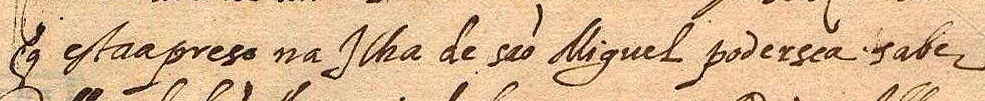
q̄ estaa preso na Jlha de saõ Miguel podersea saber
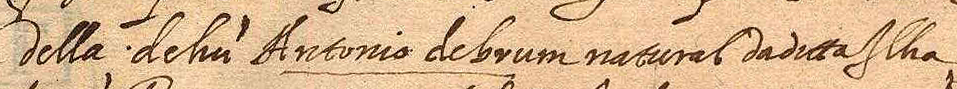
della de hū Antonio de brum natural da ditta Jlha
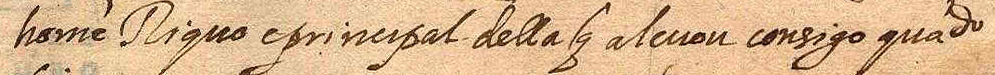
homē Riquo e principal della q̄ a leuou consigo quādo
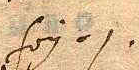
foy ./.
